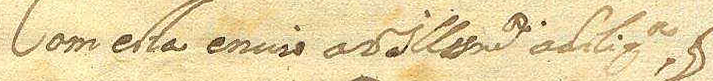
Com esta enuio a v Illssma. a diliga, q̄
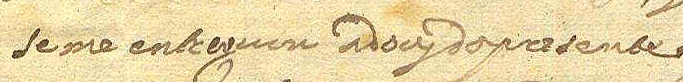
se me entreguou a dous da presente,
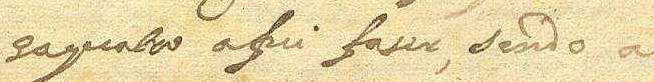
E a quatro a fui faser, sendo a
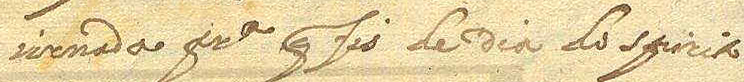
iornada pra q̄ fis de dia do spirito
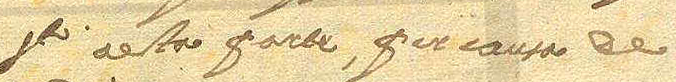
sto. a esta parte, por causa de
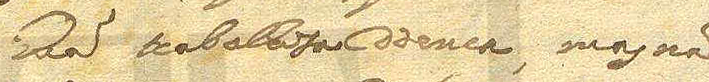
huā trabalhosa doença, mas naõ
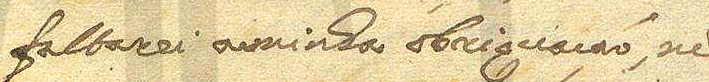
faltarei a minha obriguaçaõ, nē
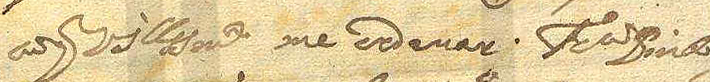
ao q̄ V Illssma me ordenou. Frco Pinto,
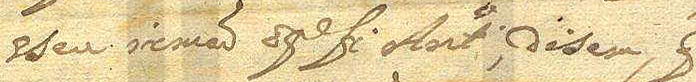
E seu irmaõ o pe fr. Anto., disem, q̄
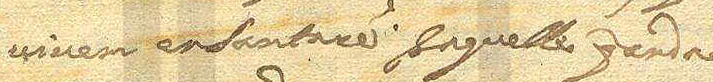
uiuem em Santarē. E aquelle q̄ anda
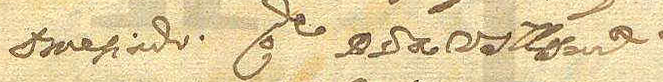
omesiado. gde Ds̄ a v Illssma.
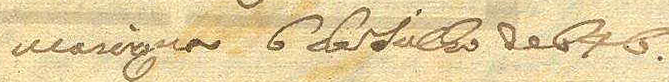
maiorgua 6 de Iulho de 646.
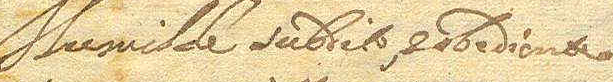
Humilde subdito, e obediente
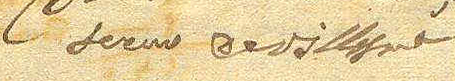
seruo de v illssma.
